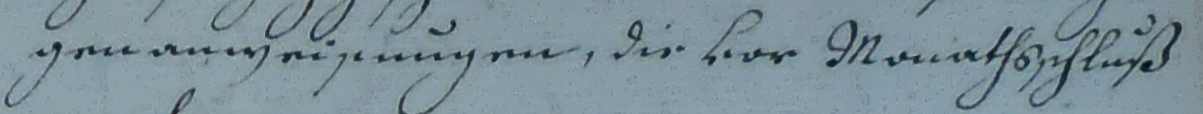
genanweisungen, die vor Monathsschluß
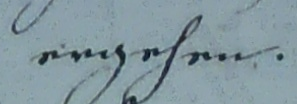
ergehen,
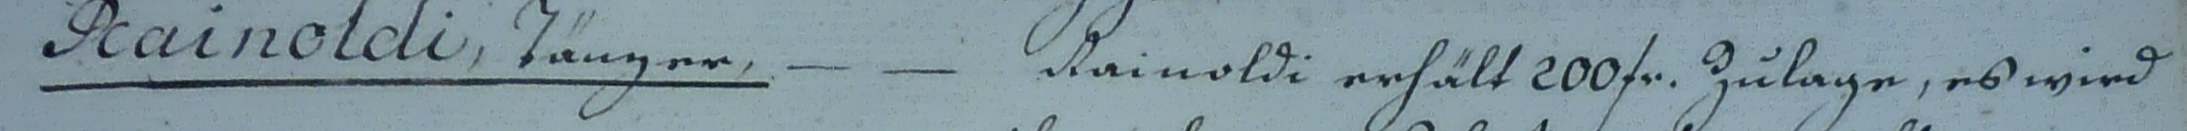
Rainoldi, Tänzer, _ _ Rainoldi erhält 200 fr. Zulage, es wird
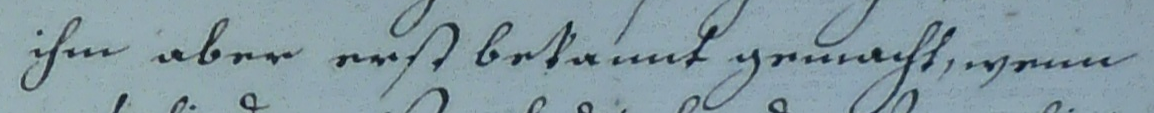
ihm aber erst bekannt gemacht, wenn
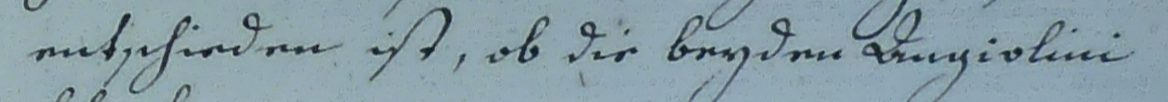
entschieden ist, ob die beyden Angiolini
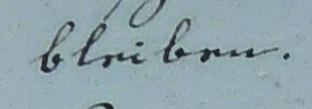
bleiben.
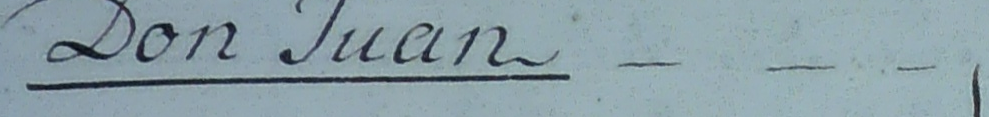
Don Juan _ _ _
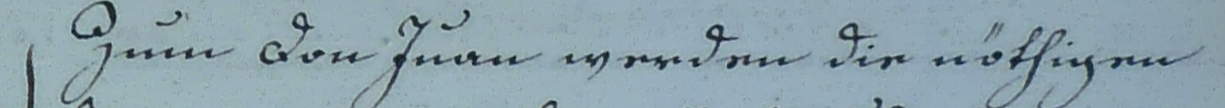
Zum Don Juan werden die nöthigen
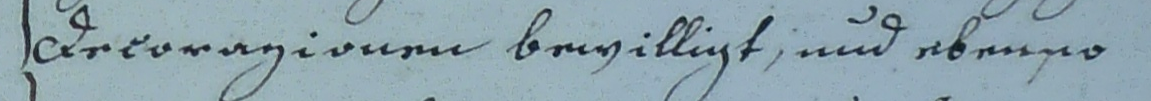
Decorazionen bewilligt, und ebenso
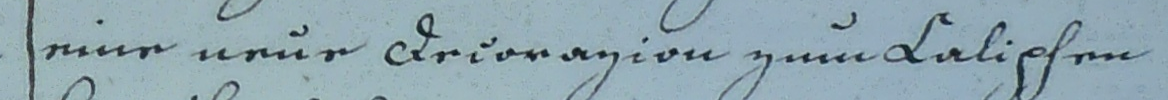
eine neue Decorazion zum Caliphen
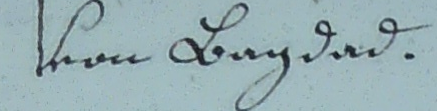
von Bagdad.
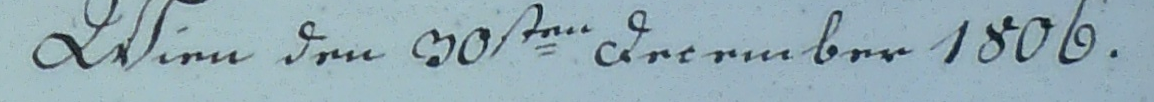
Wien den 30ste͇n December 1806.
